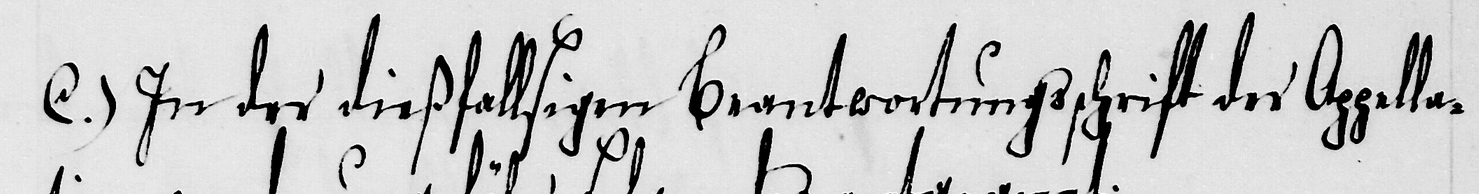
C.) In der dießfallsigen Beantwortungsschrift der A¬
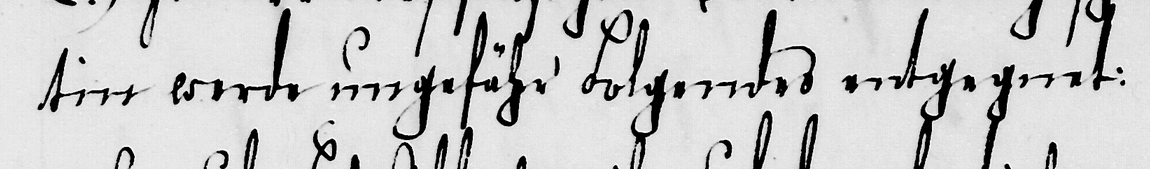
tin werde ungefähr Folgendes entgegnet:
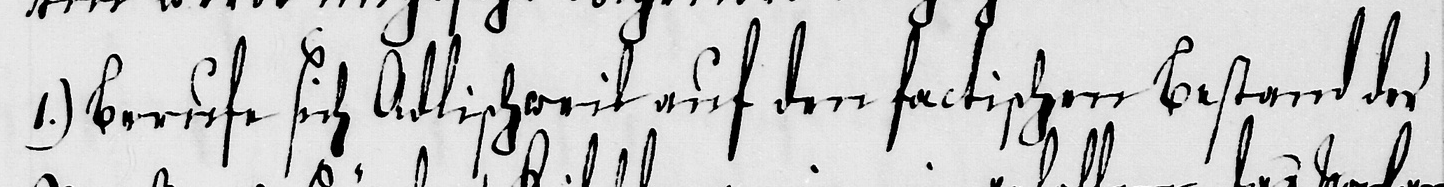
1.) Berufe sich Adlischweil auf den factischen Bestand der
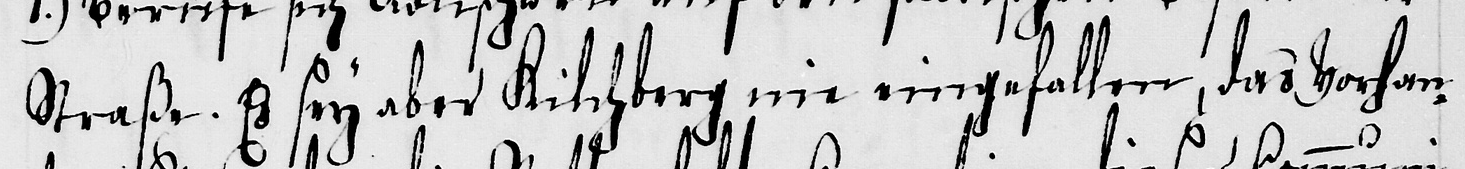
Straße. Es sey aber Kilchberg nie eingefallen, das Vorhan¬
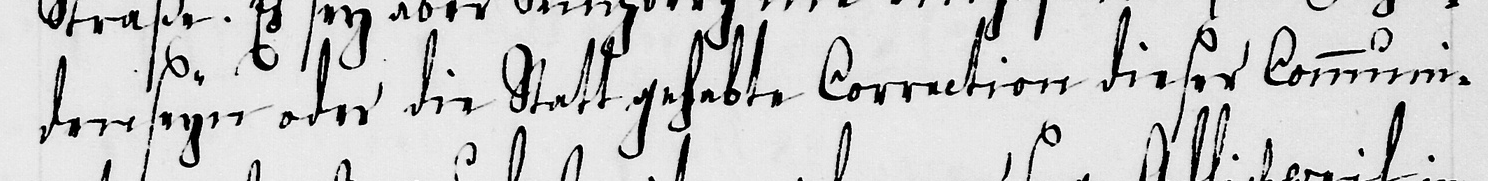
denseyn oder die Statt gehabte Correction dieser Communi¬
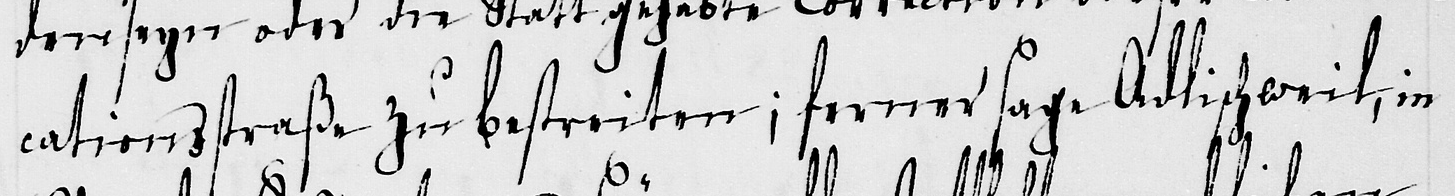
cationsstraße zu bestreiten; ferner seye Adlischweil, in
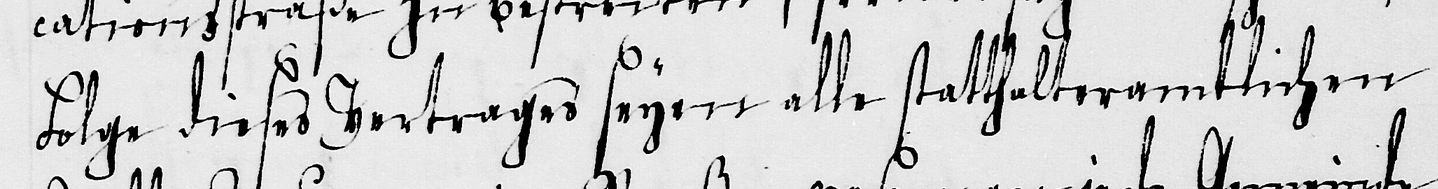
Folge dieses Vertrages seyen alle statthalteramtlichen
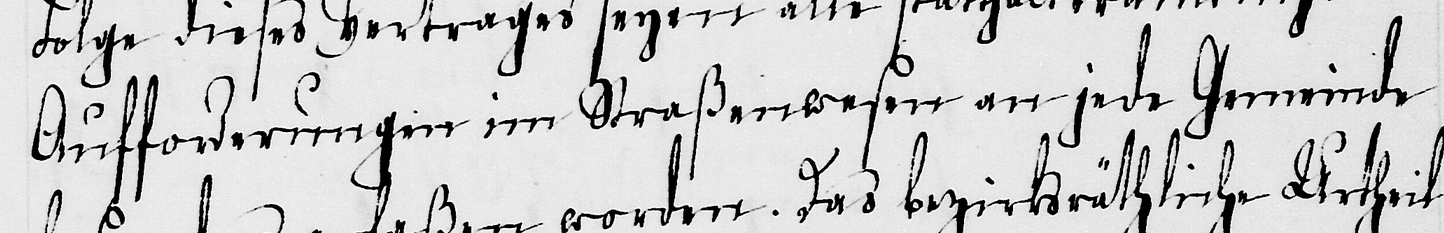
Aufforderungen im Straßenwesen an jede Gemeinde
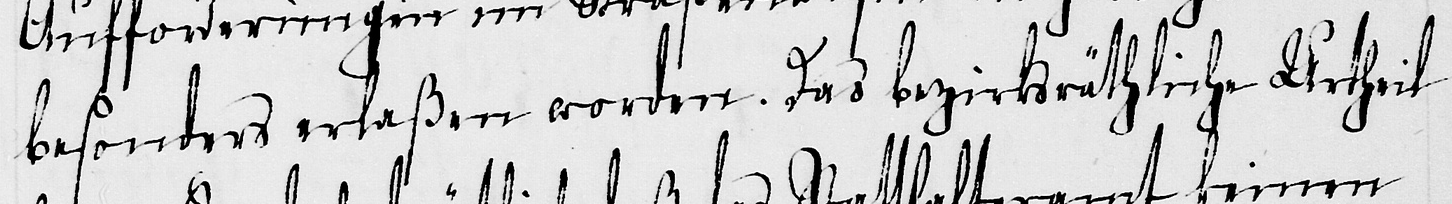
besonders erlaßen worden. Das bezirksräthliche Urtheil
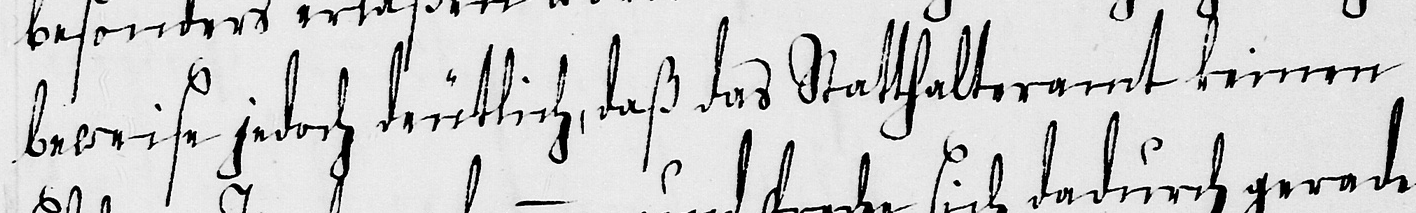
beweise jedoch deutlich, daß das Statthalteramt keinen
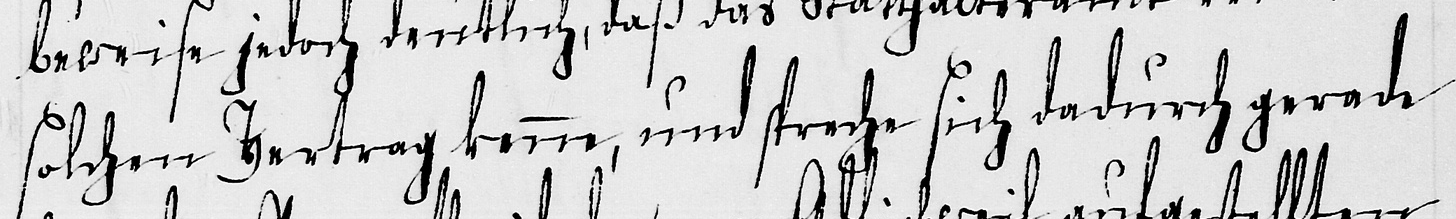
solchen Vertrag kenne, und spreche sich dadurch gerade
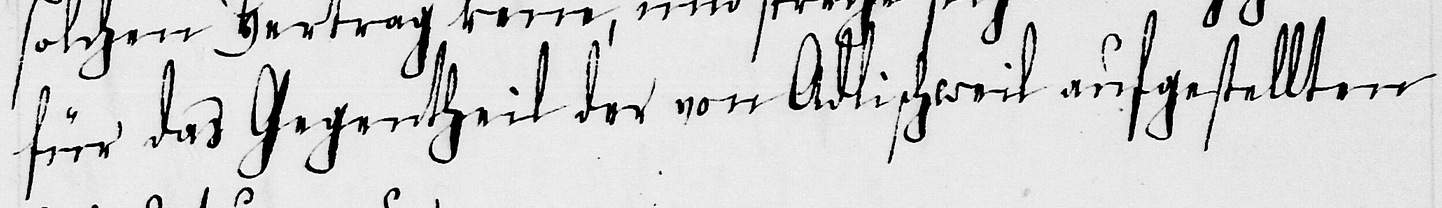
für das Gegentheil der von Adlischweil aufgestellten
